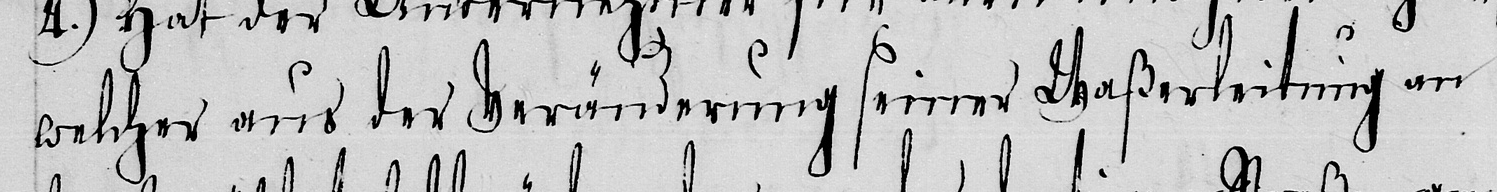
welcher aus der Veränderung seiner Waßerleitung an
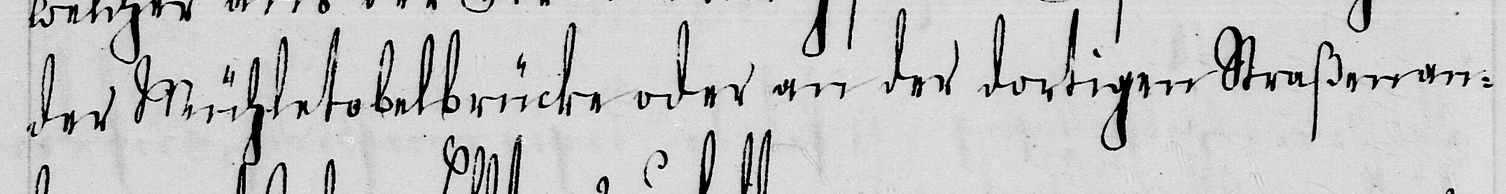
der Mühletobelbrücke oder an der dortigen Straßenan¬
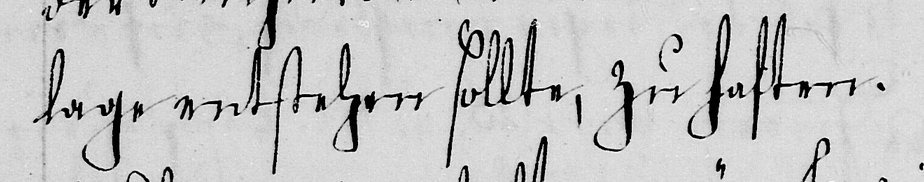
lage entstehen sollte, zu haften.
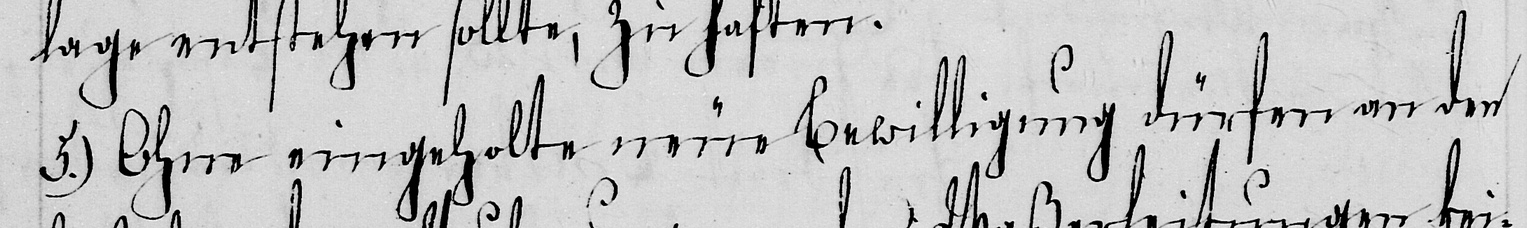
5.) Ohne eingeholte neue Bewilligung dürfen an den
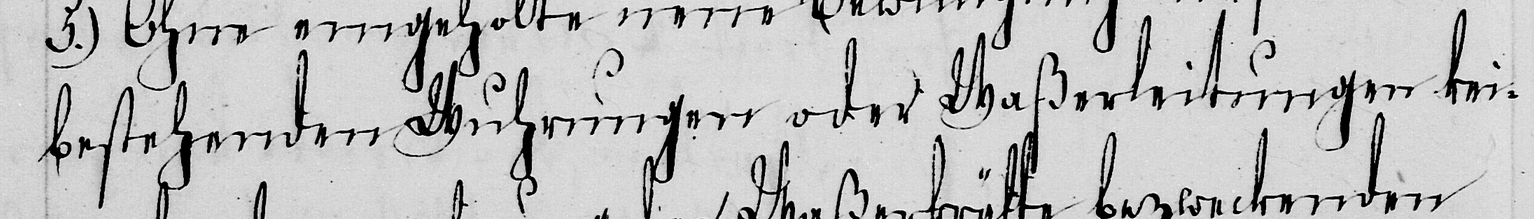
bestehenden Wuhrungen oder Waßerleitungen kei¬
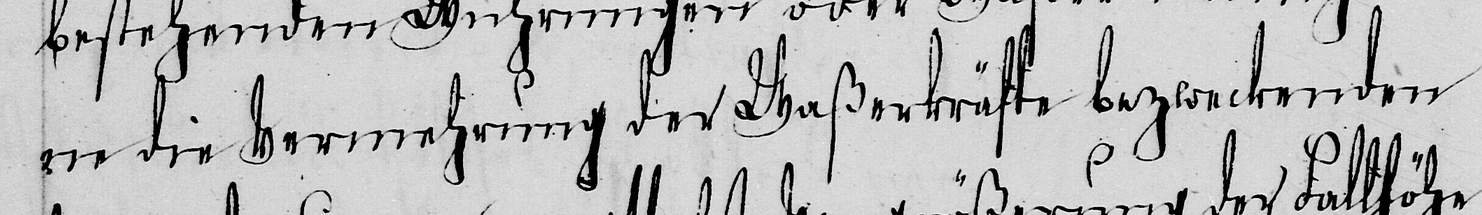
ne die Vermehrung der Waßerkräfte bezweckenden
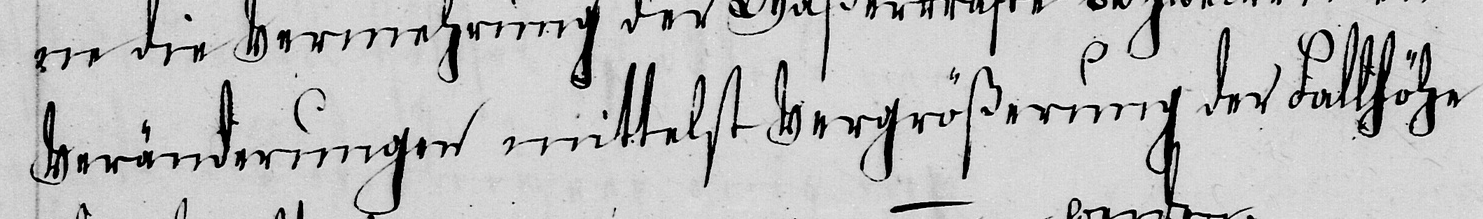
Veränderungen mittelst Vergrößerung der Fallhöhe
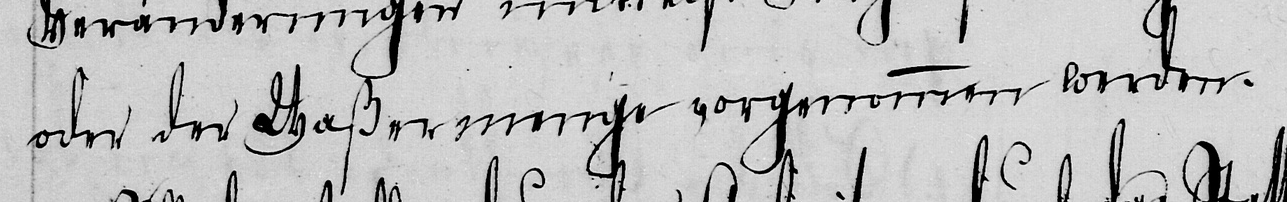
oder der Waßermenge vorgenommen werden.
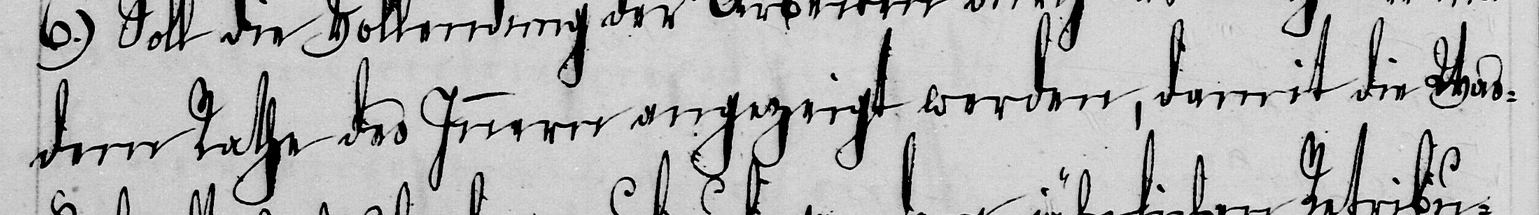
dem Rathe des Innern angezeigt werden, damit die Waß¬
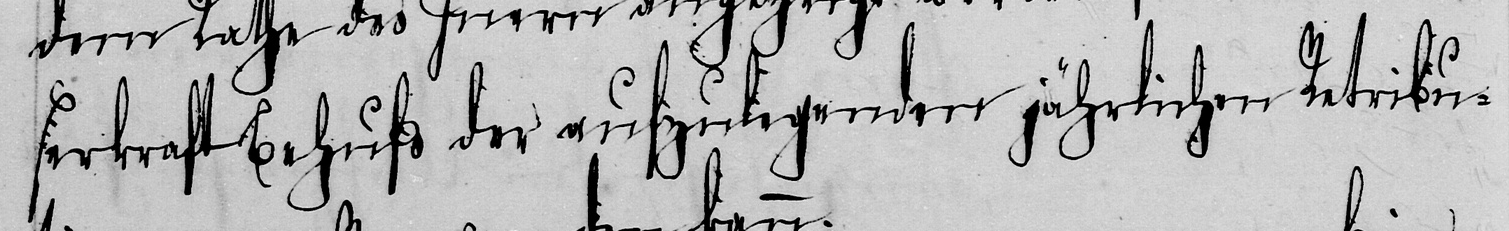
erkraft Behufs der aufzulegenden jährlichen Retribu¬
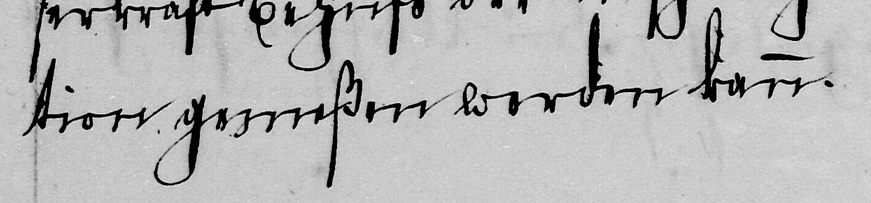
tion gemeßen werden kann.
